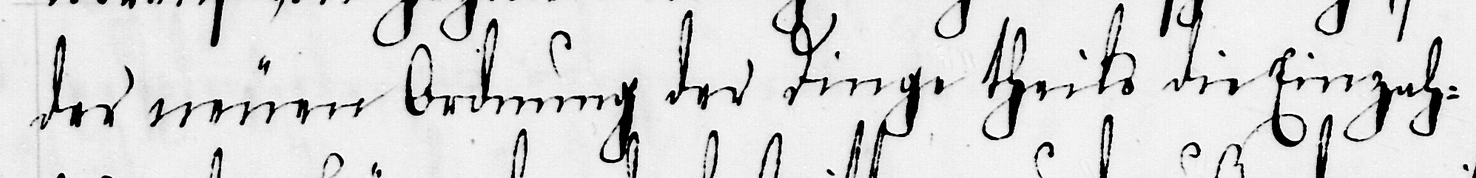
der neuen Ordnung der Dinge theils die Einzah¬
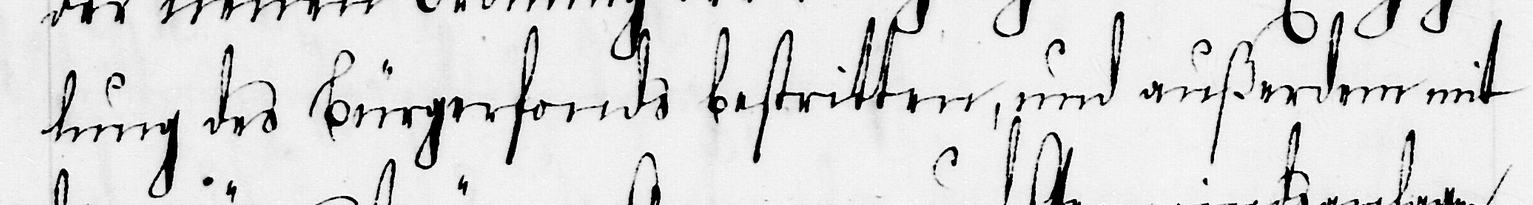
lung des Bürgerfonds bestritten, und außerdem mit
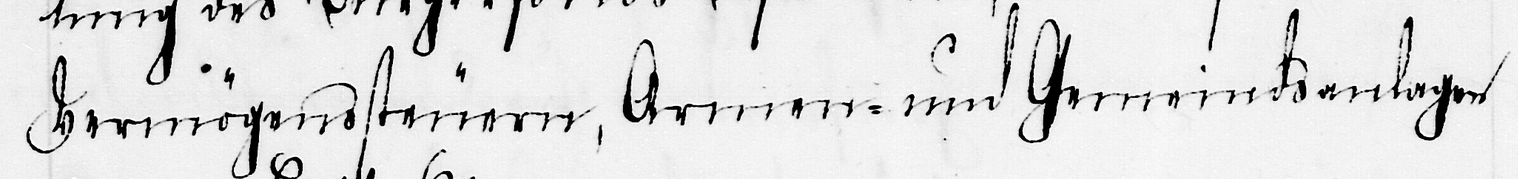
Vermögenssteuern, Armen- und Gemeindsanlagen
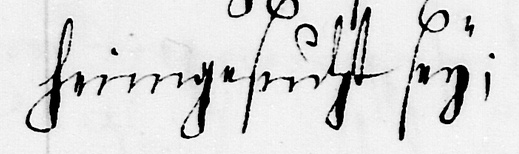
heimgesucht sey;
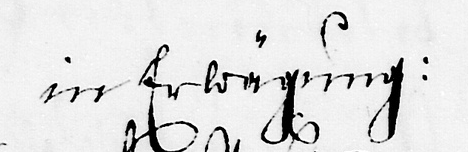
in Erwägung:
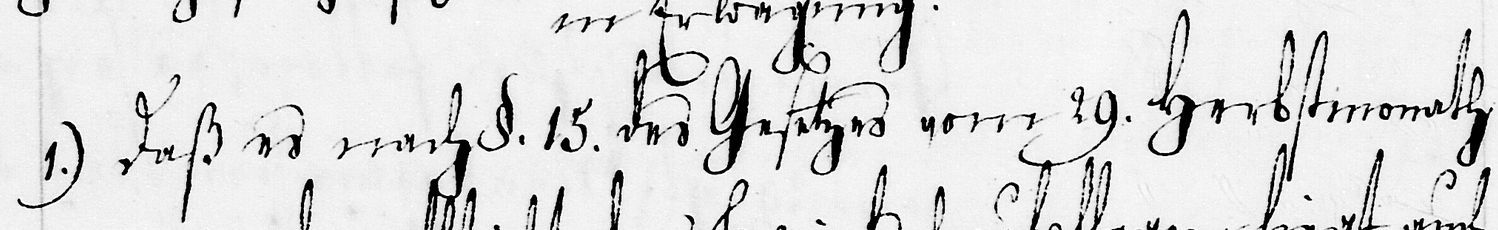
1.) Daß es nach §. 15. des Gesetzes vom 29. Herbstmonath
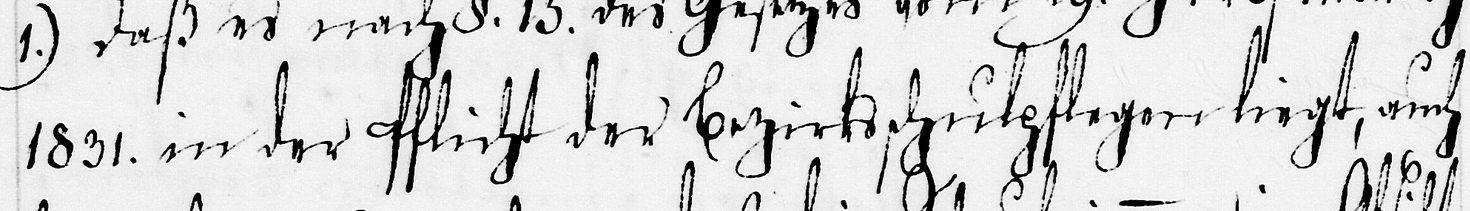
1831. in der Pflicht der Bezirksschulpflegen liegt, au¬
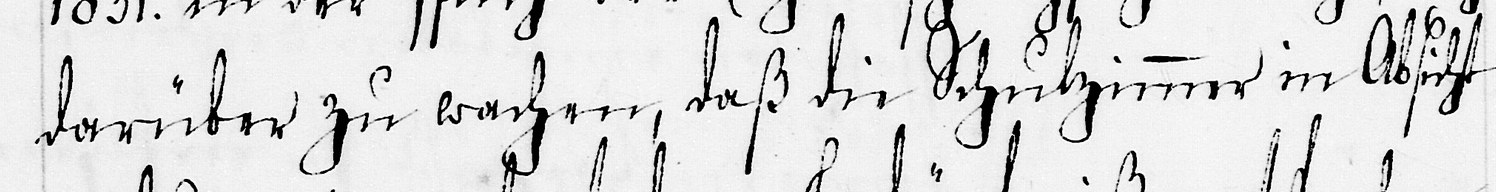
darüber zu wachen, daß die Schulzimmer in Absicht
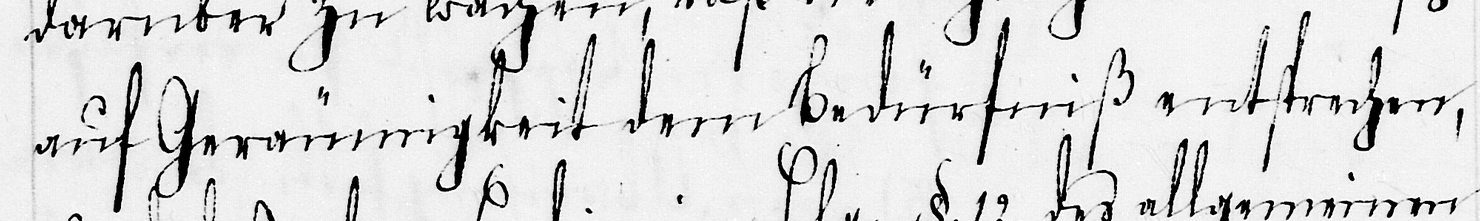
auf Geräumigkeit dem Bedürfniß entsprechen,
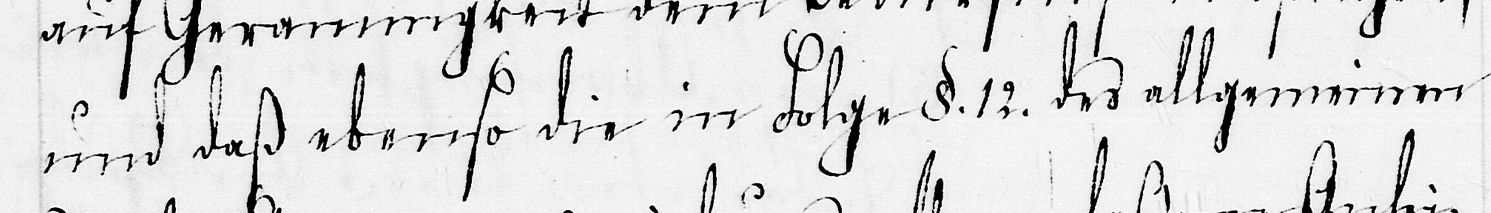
und daß ebenso die in Folge §. 12. des allgemeinen
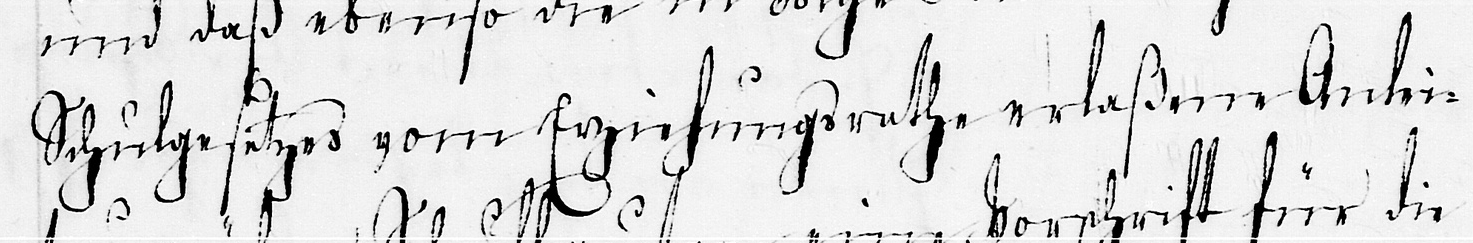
Schulgesetzes vom Erziehungsrathe erlaßene Anlei¬
